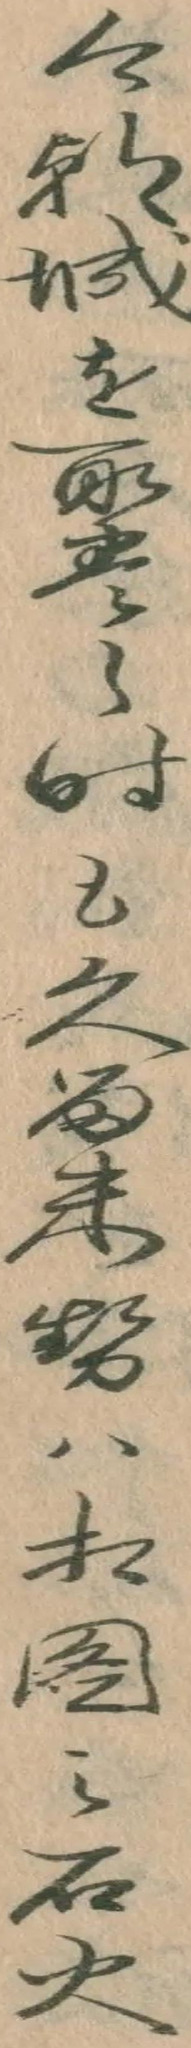今朝城を取巻し時も久留米勢は相図之石火
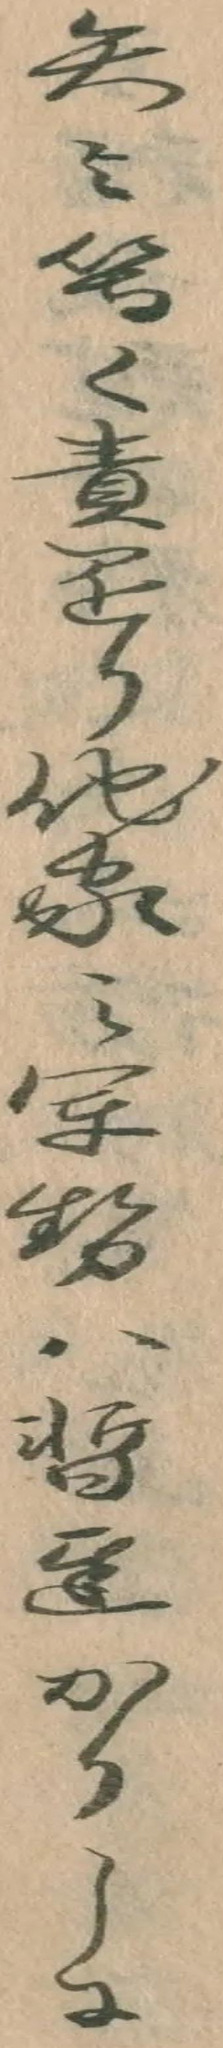矢与等く責懸り他家之軍勢は暫遅かりし尓
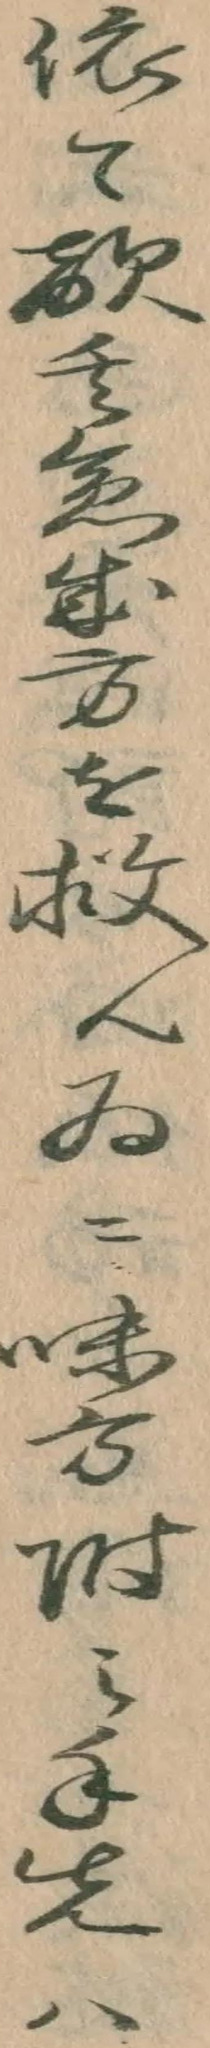依て敵其急成方を救んゐに味方附之手先は
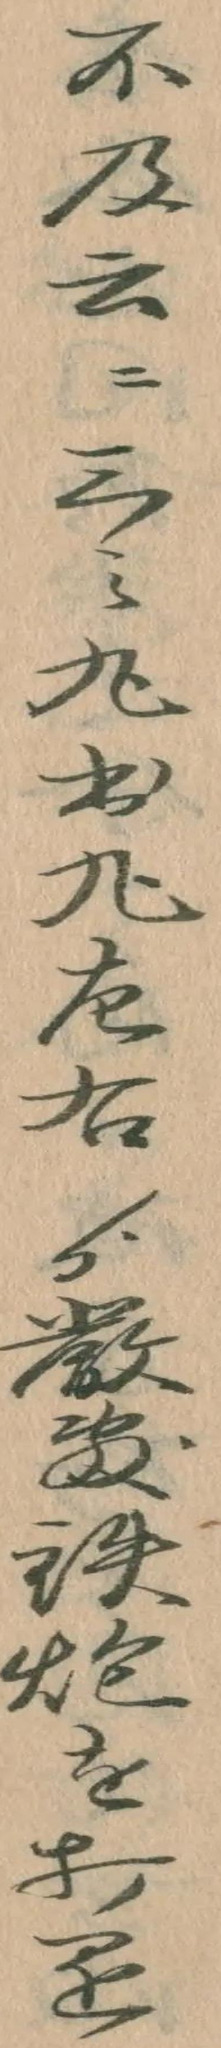不及云に三之丸出丸左右ゟ厳敷鉄炮を打懸
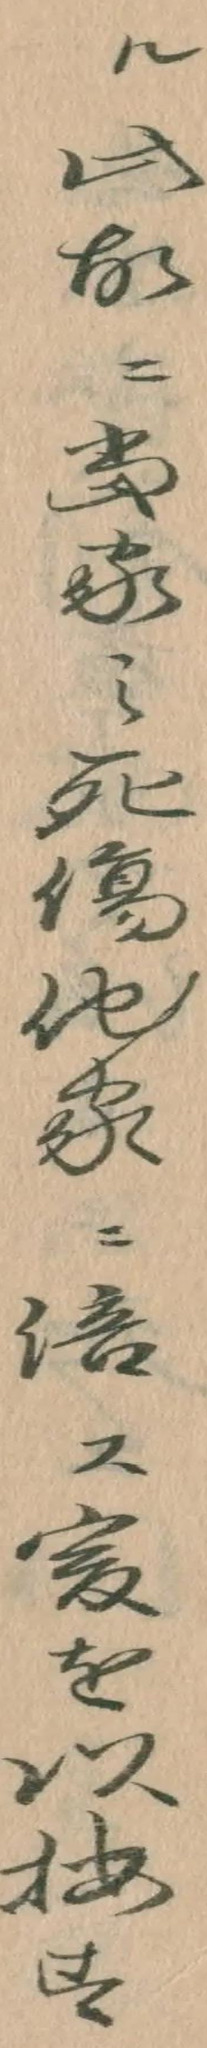る此故に当家之死傷他家に倍す爰を以按春
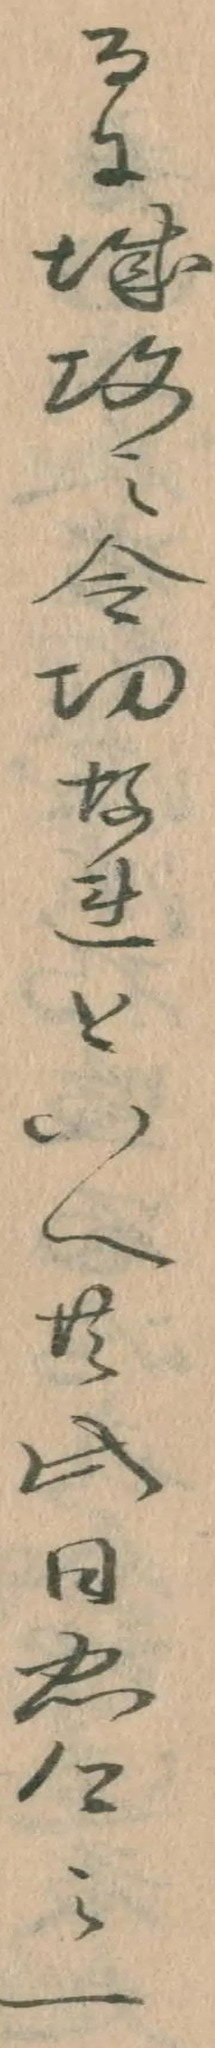る尓城攻之令切な連といへ共此日忠郷之一
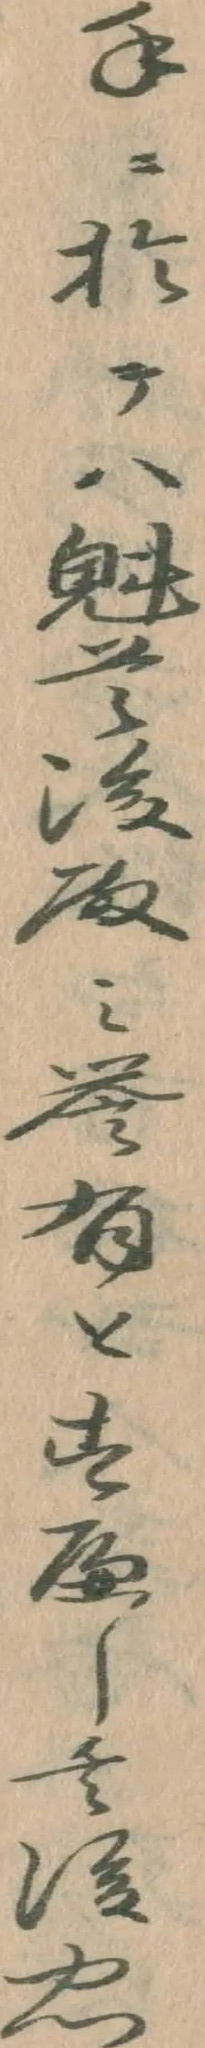手に於ては魁首後藤之誉有と春扁し其後忠
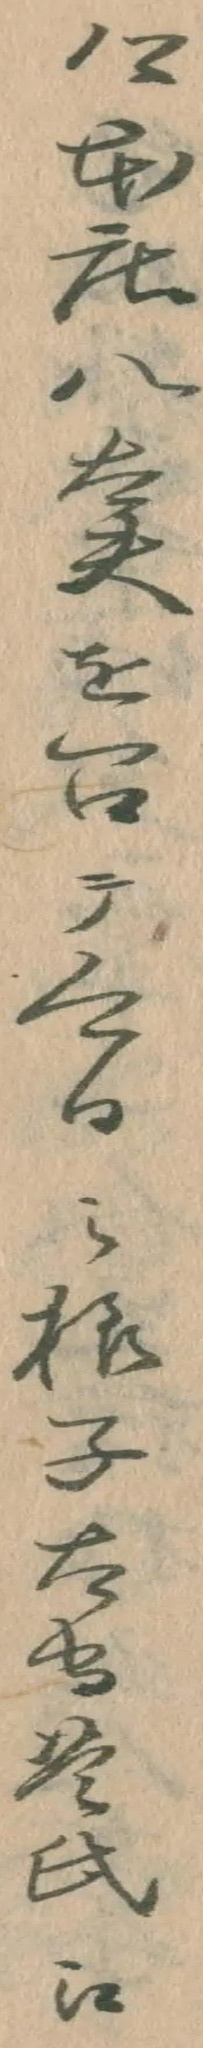郷本庄八太夫を召て今日之様子太守豊氏江
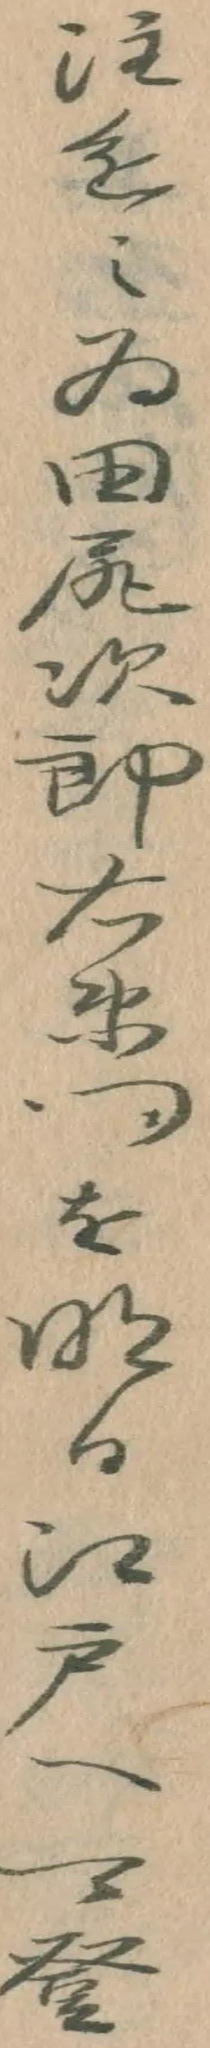注進之ゐ田尻次郎右衛門を明日江戸へか登
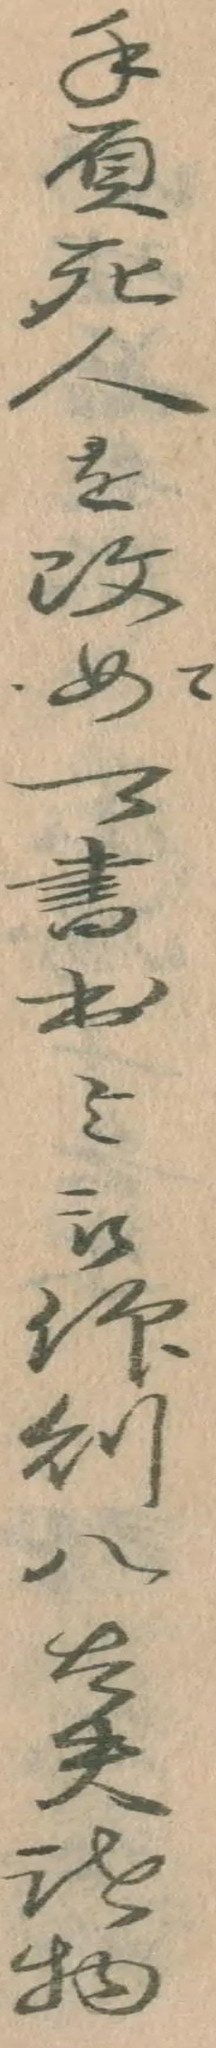手負死人を改て可書出与被仰則八太夫諸物
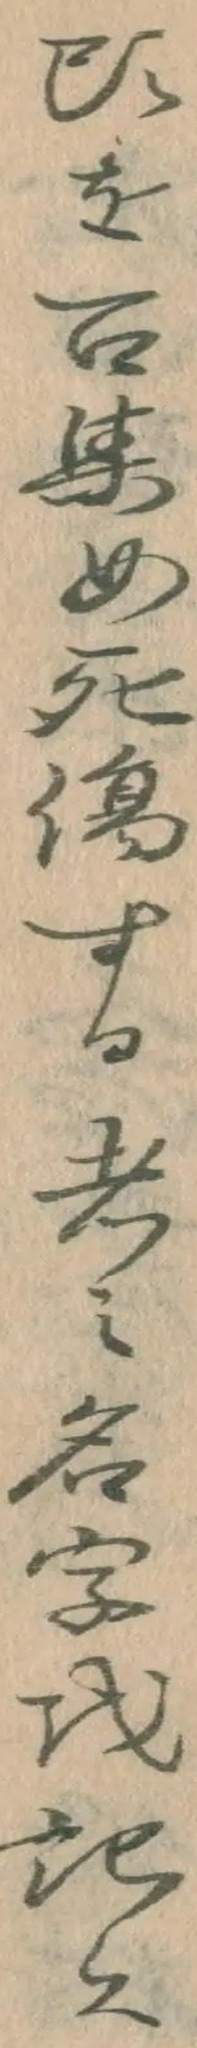頭を召集め死傷する者之名字越記す
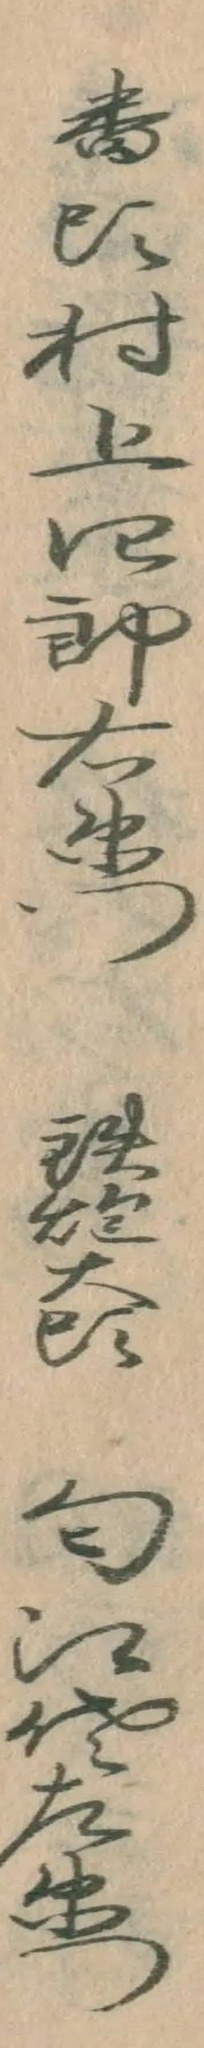番頭村上四郎右衛門鉄炮大頭匂江佐左衛門
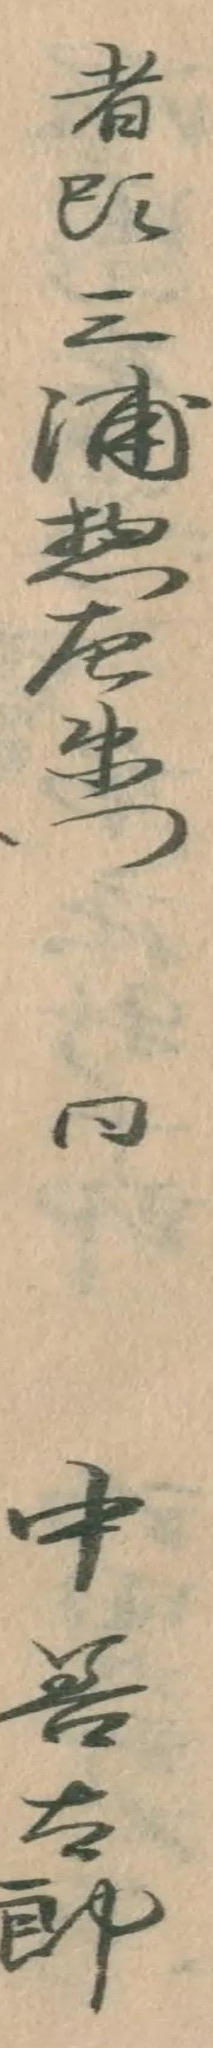者頭三浦惣左衛門同中善太郎

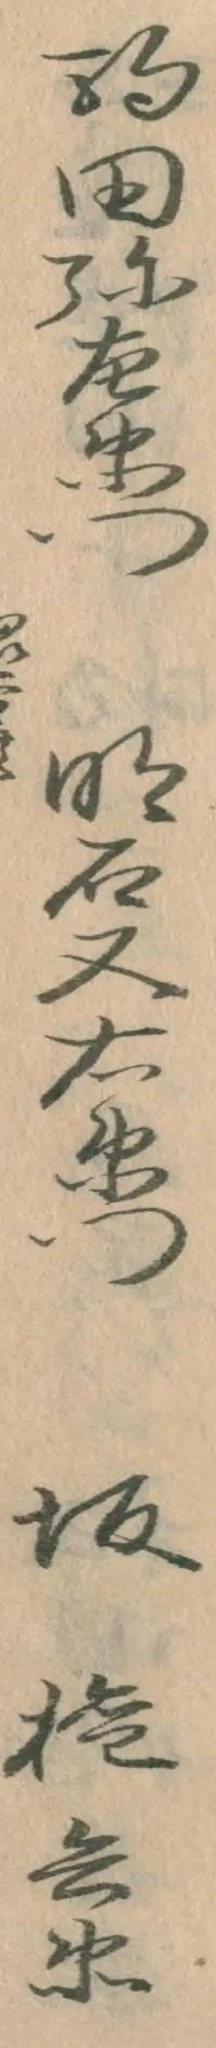駒田弥左衛門明石又右衛門坂権兵衛
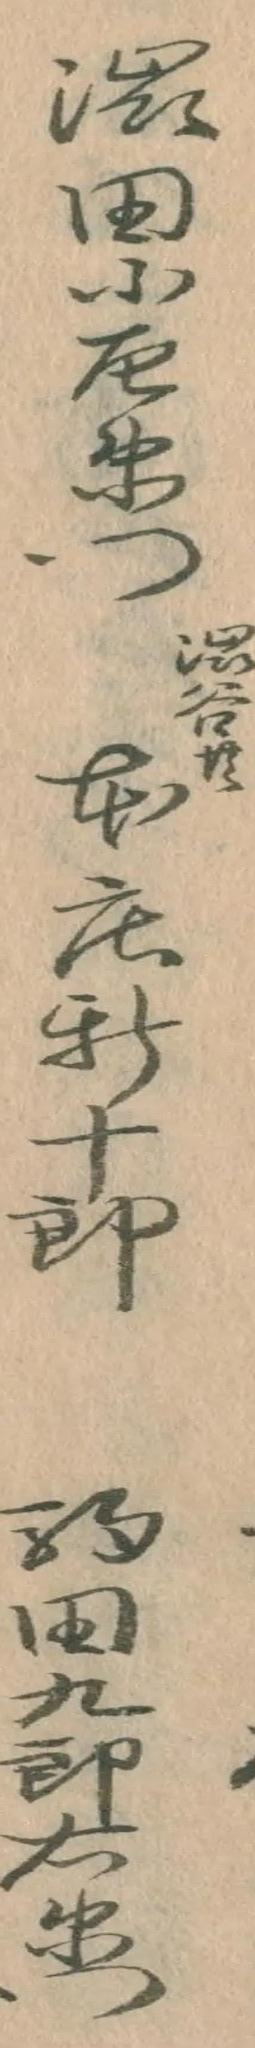渋田小左衛門本庄新十郎駒田九郎右衛門
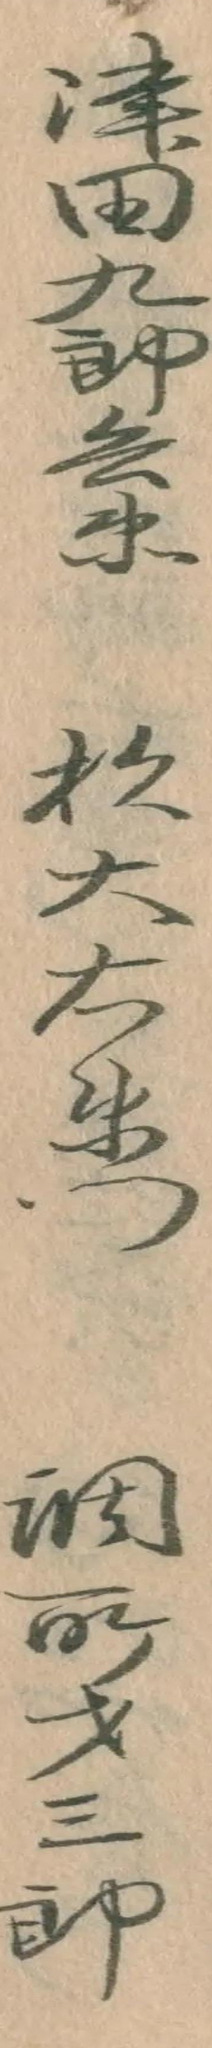津田九郎兵衛杉大右衛門調所才三郎
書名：切支丹御退治記 49巻. [5]
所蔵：国立国会図書館 National Diet Library, JAPAN
